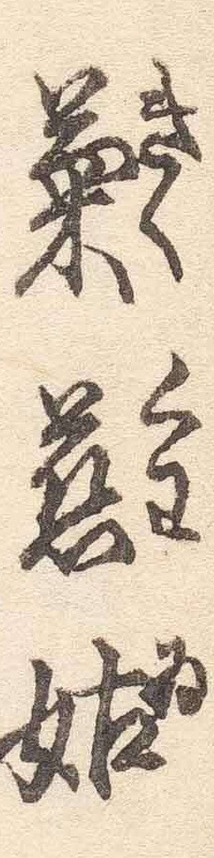菊慈姑
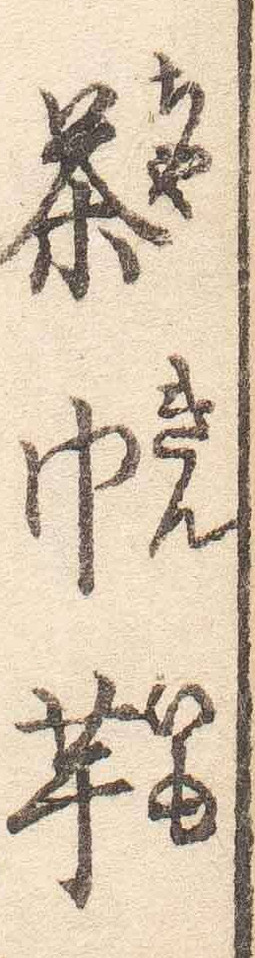茶巾芋
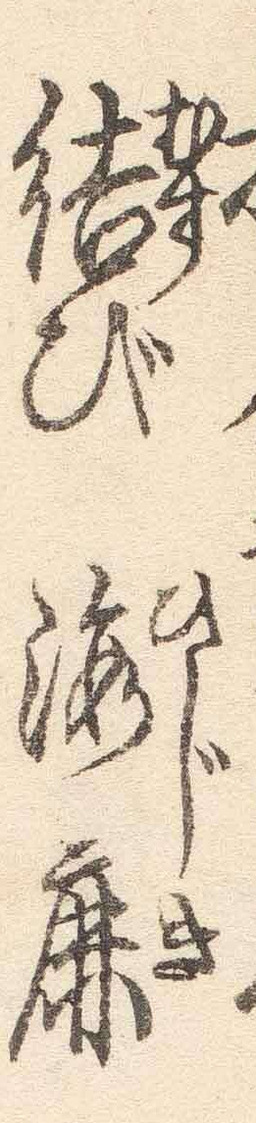結び海鹿
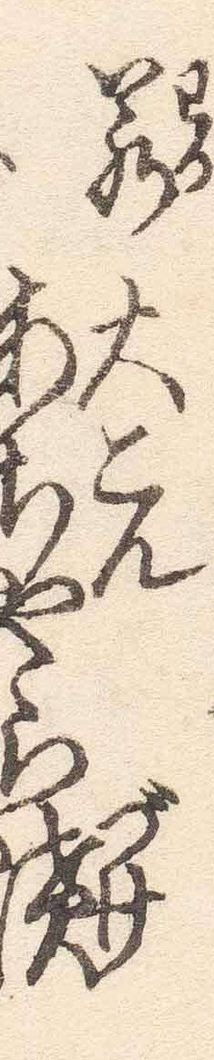あちやら漬
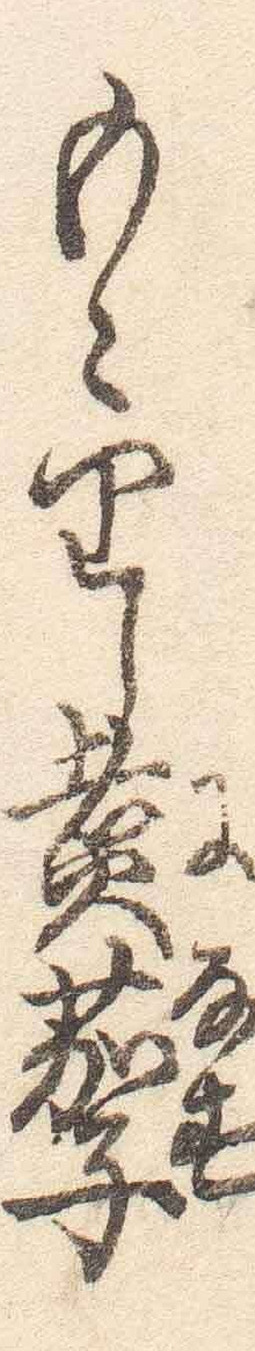もヽりし煮茄子
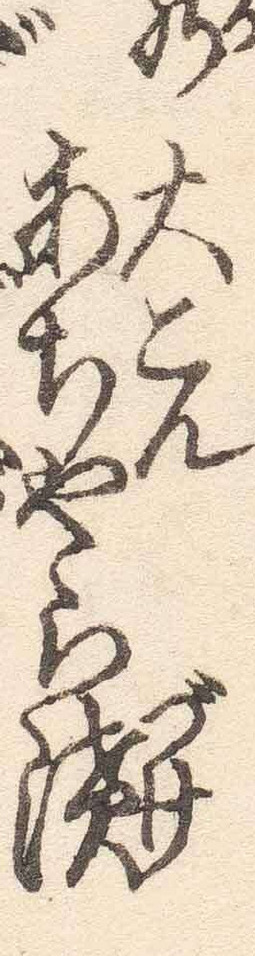あちやら漬
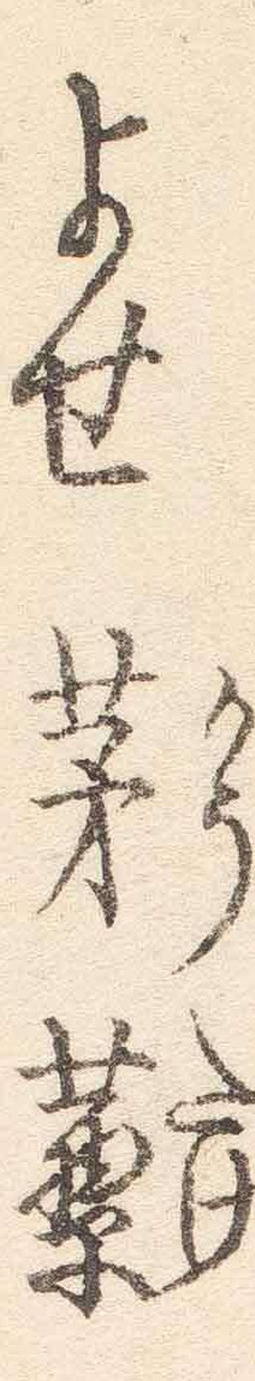よせ茅蕈
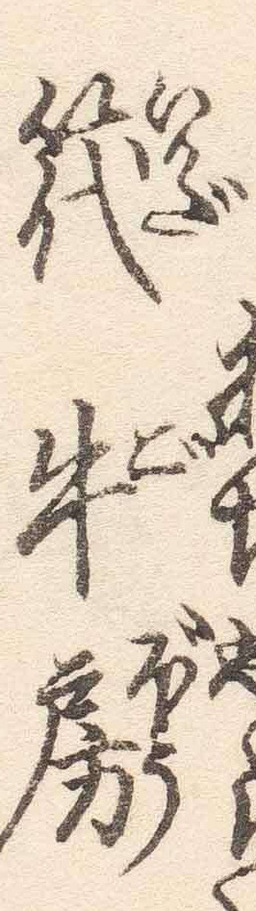筏牛蒡
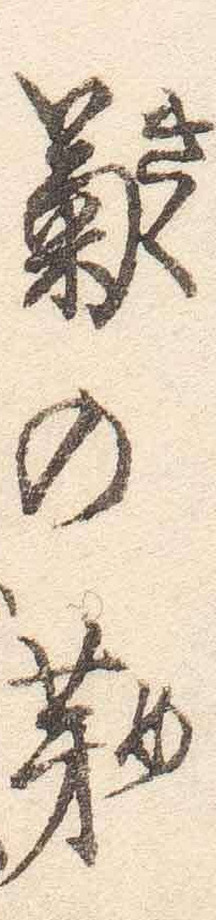菊の芽
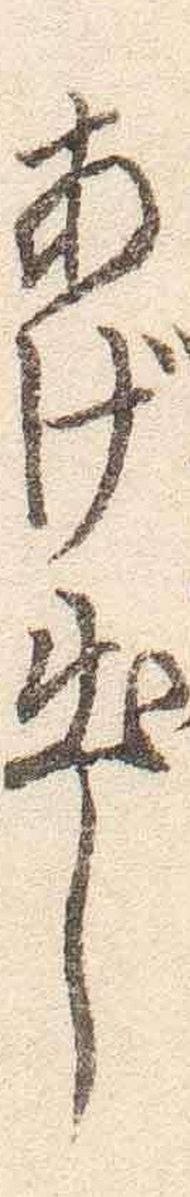あげ出し
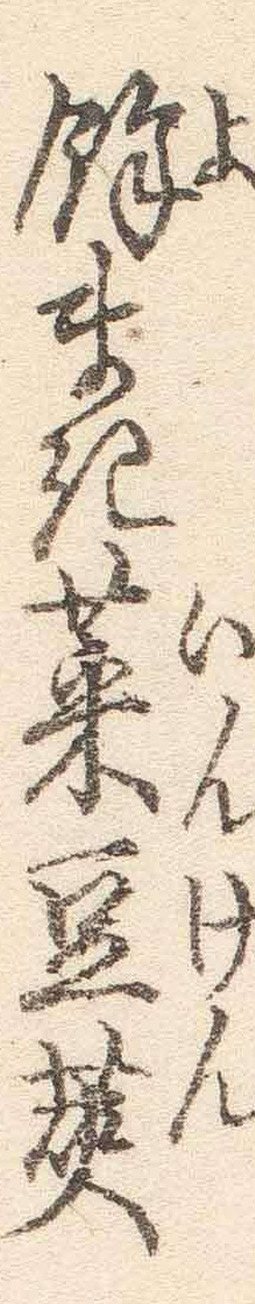余まき菜豆莢
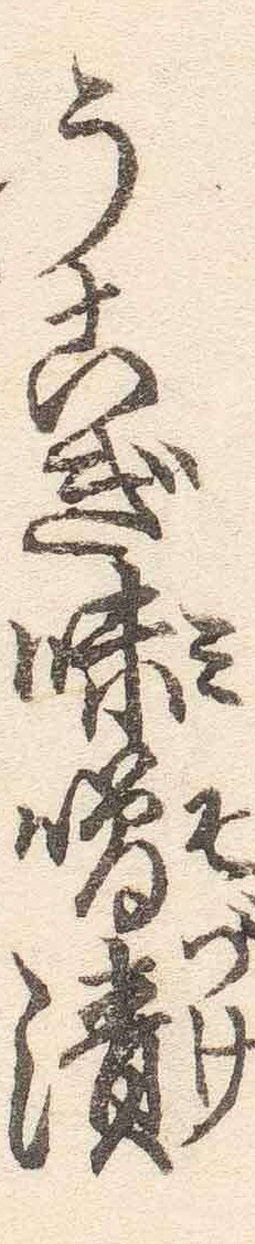うこぎ味噌漬
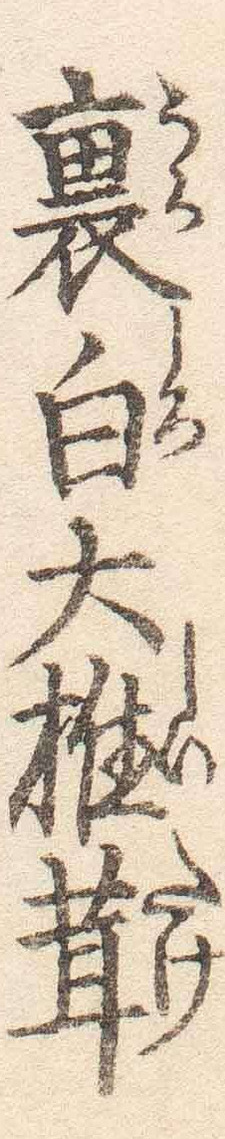裏白大椎茸
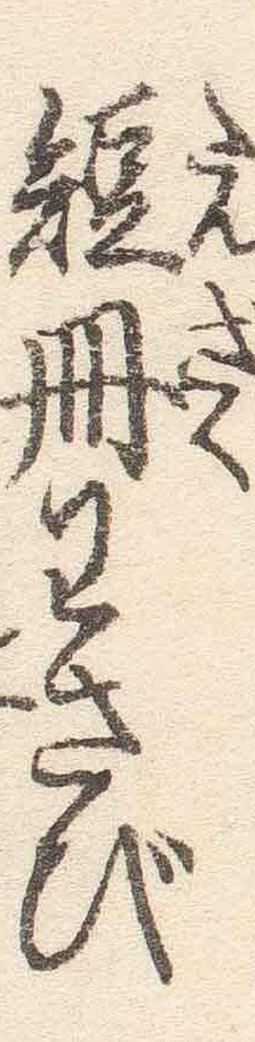短冊わさび
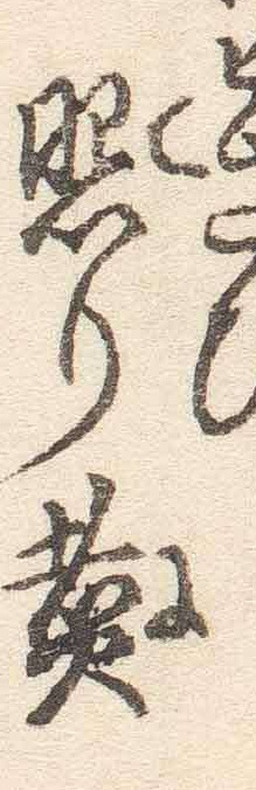照り煮
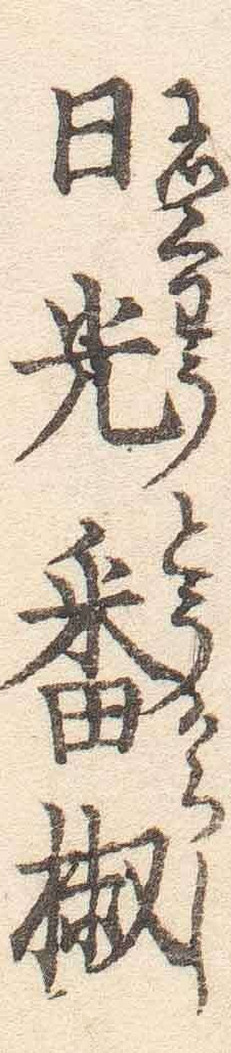日光番椒
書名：料理通
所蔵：東京学芸大学附属図書館 国文学研究資料館
